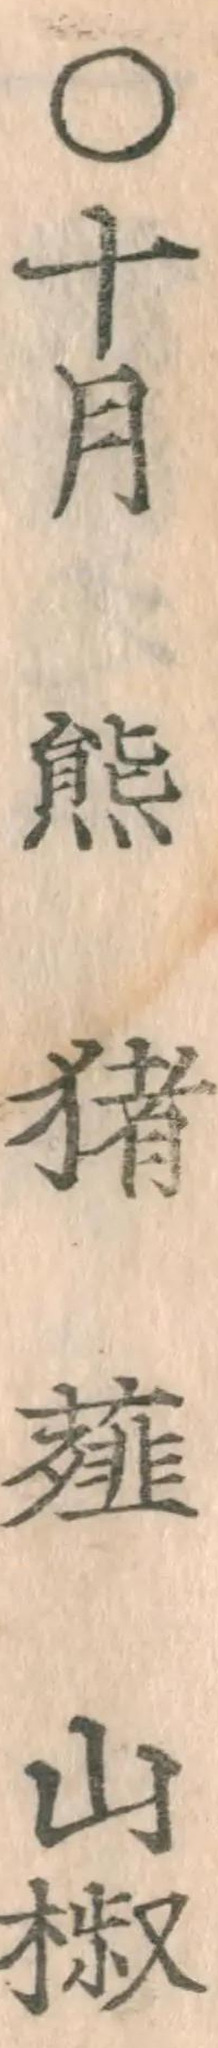〇十月熊猪薤山椒
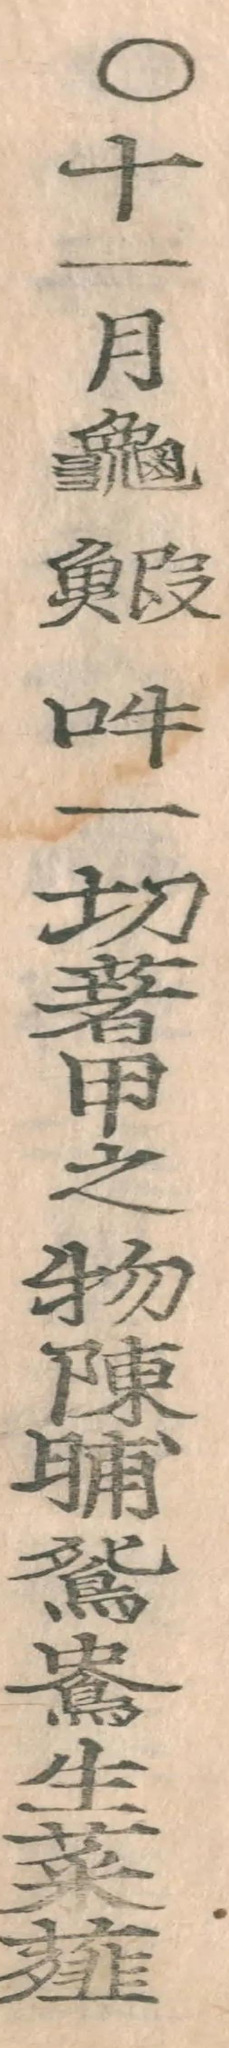〇十一月亀鰕吽一切著甲之物陳脯鴛鴦生菜薤

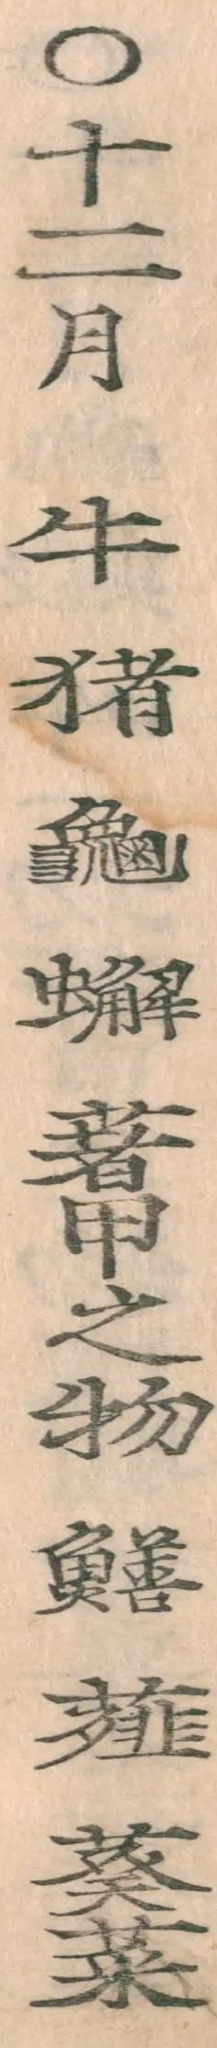〇十二月牛猪亀蟹著甲之物鱔薤葵菜
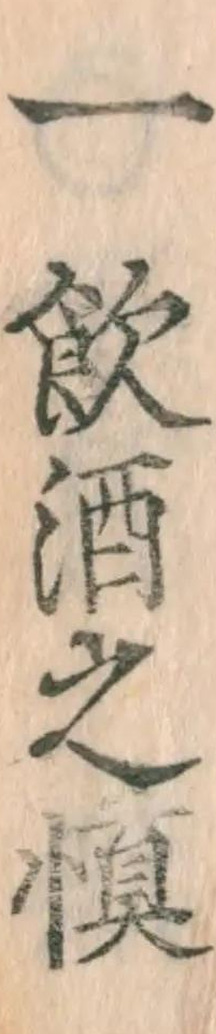一飲酒之慎
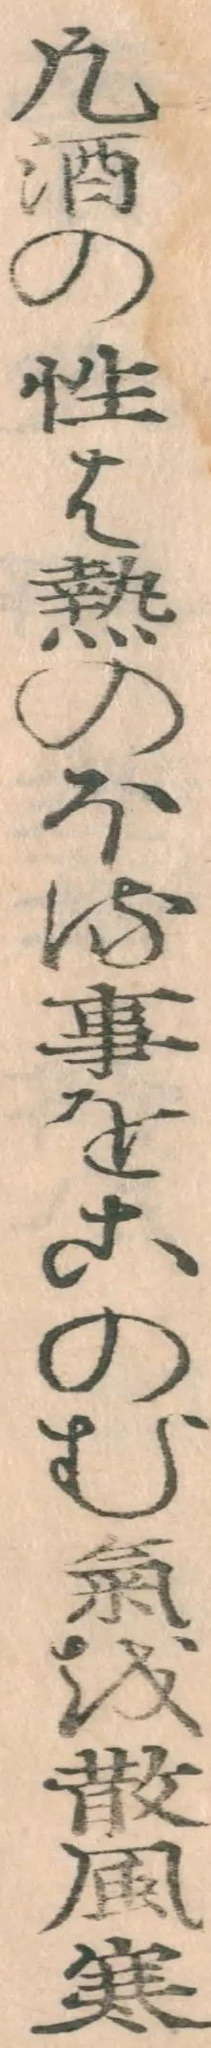凡酒の性は熱のほる事をこのむ気を散風寒
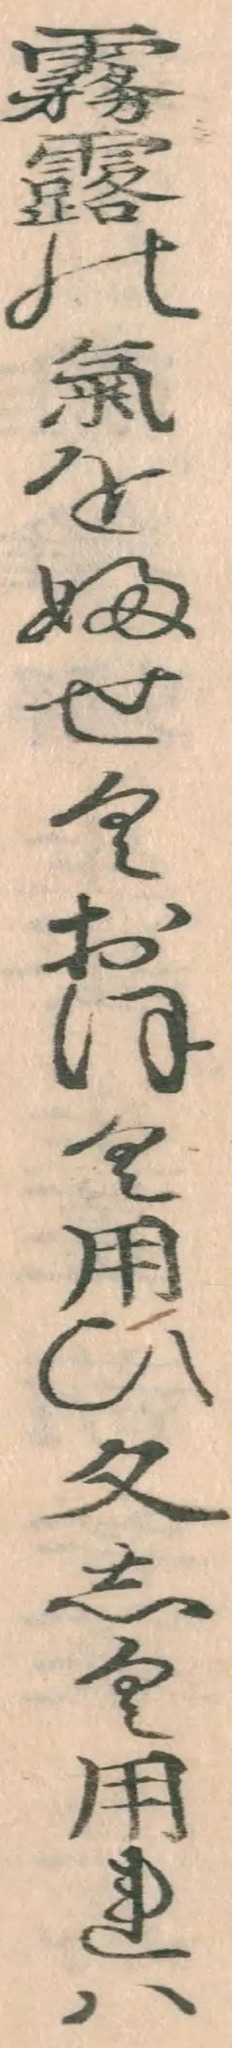霧露の気をふせくおほく用ひ久しく用れは
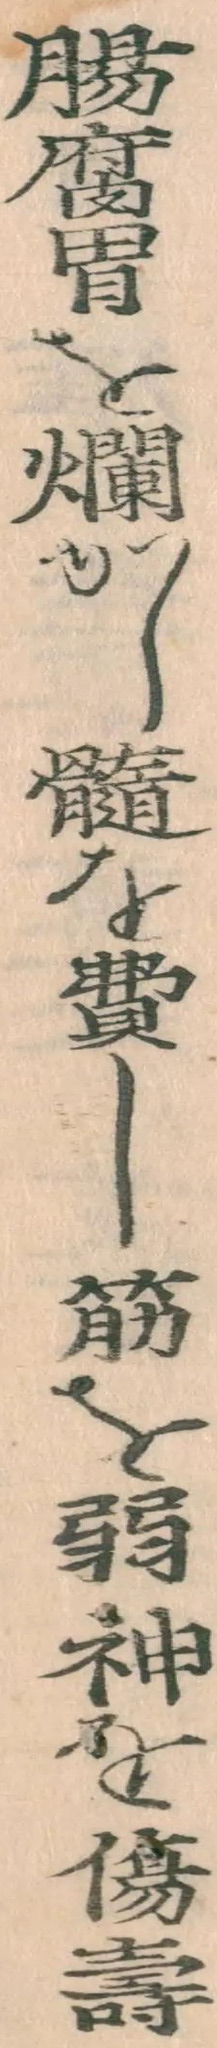腸腐胃を燗かし髄を費し筋を弱神を傷寿
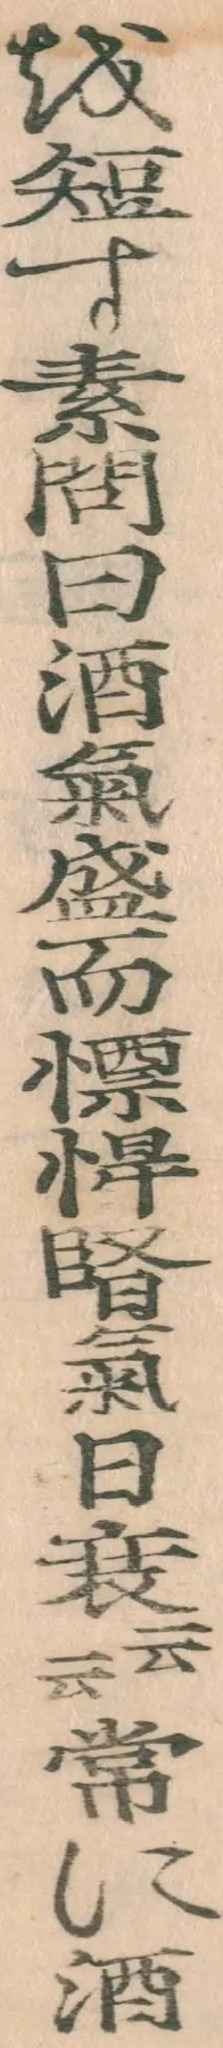を短す素問曰酒気盛而慓悍腎気日衰云云常に酒
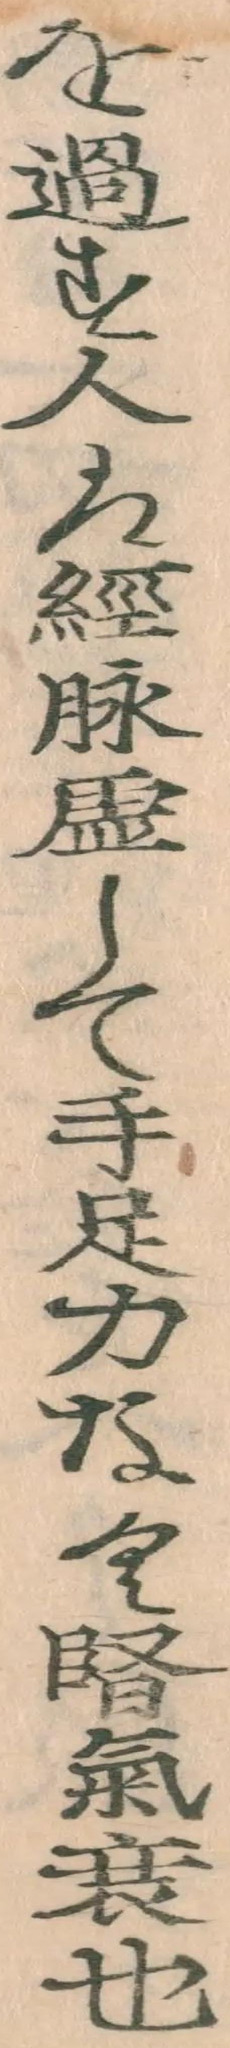を過す人は経脈虚して手足力なく腎気衰也
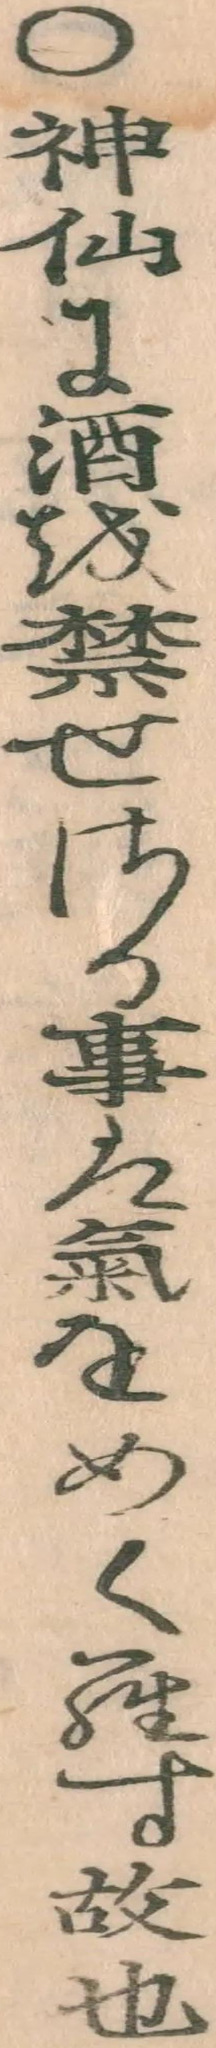〇神仙に酒を禁せさる事は気めくらす故也
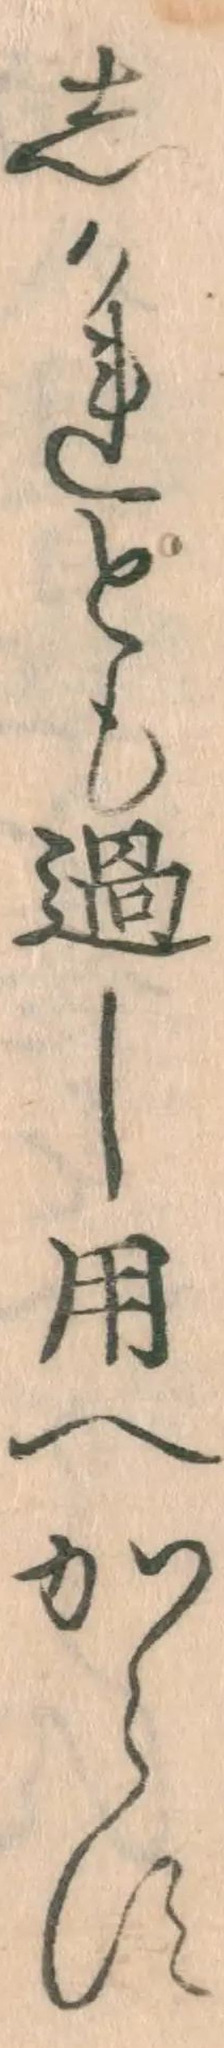しかれとも過し用へからす
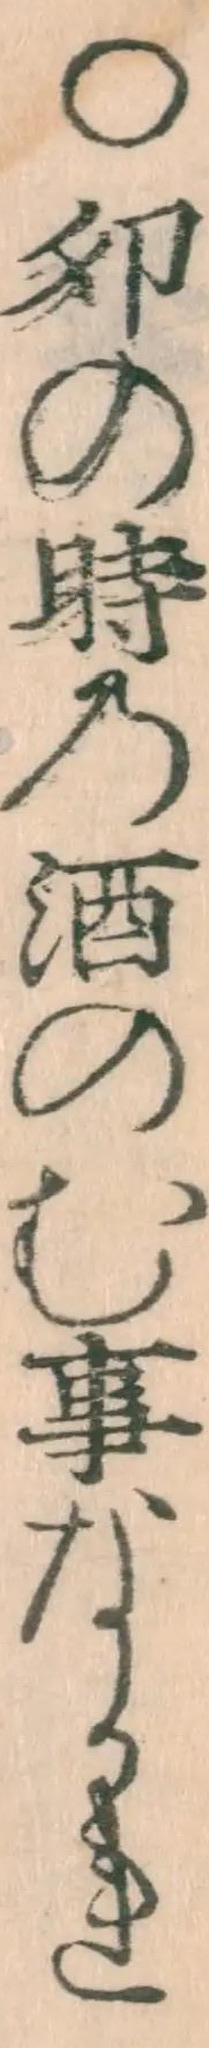〇卯の時の酒のむ事なかれ
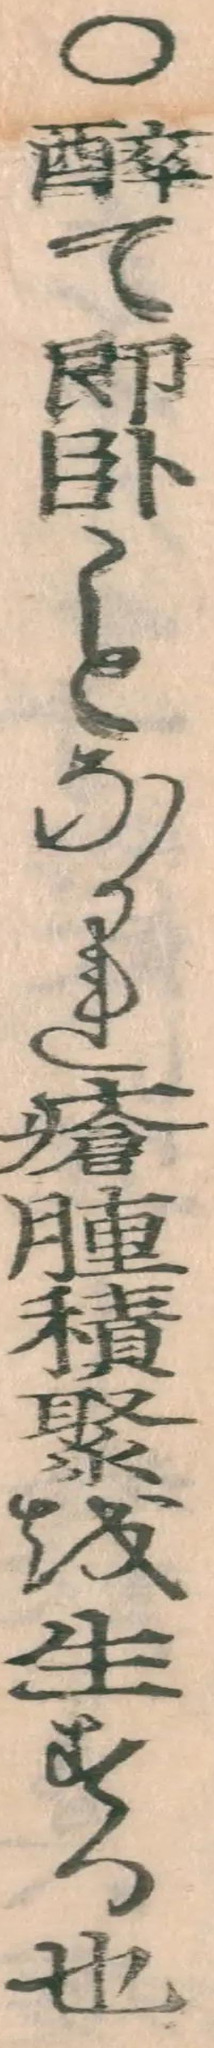〇酔て即臥ことなかれ瘡腫積聚を生する也
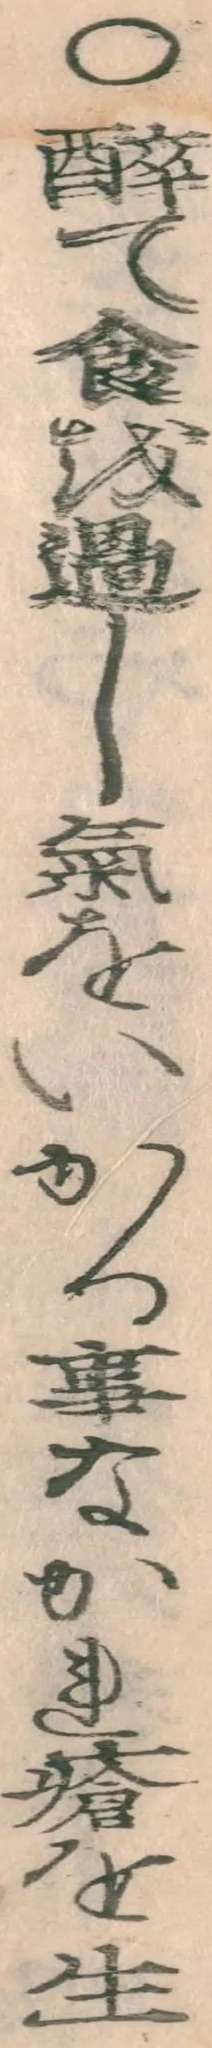〇酔て食を過し気をいかる事なかれ瘡を生
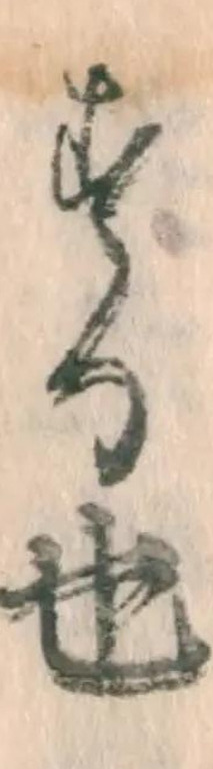する也
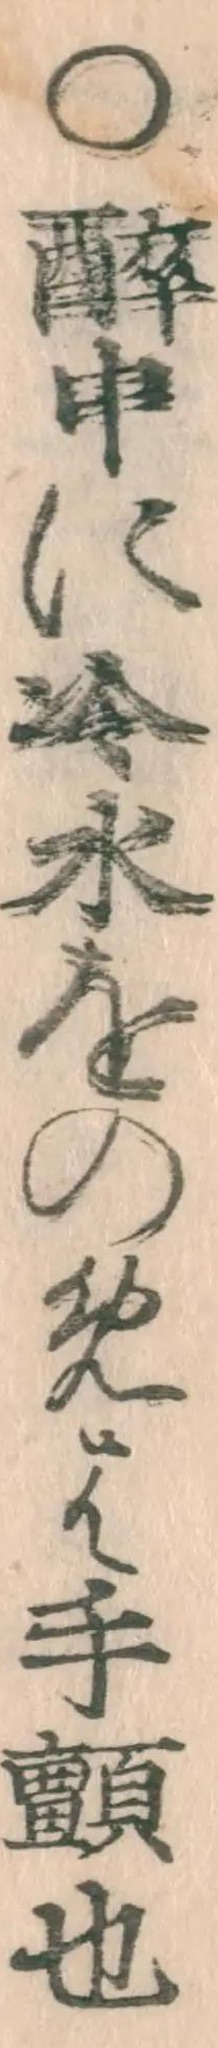〇酔中に冷水をのめは手顫也
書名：延壽撮要
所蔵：国立国会図書館 National Diet Library, JAPAN
